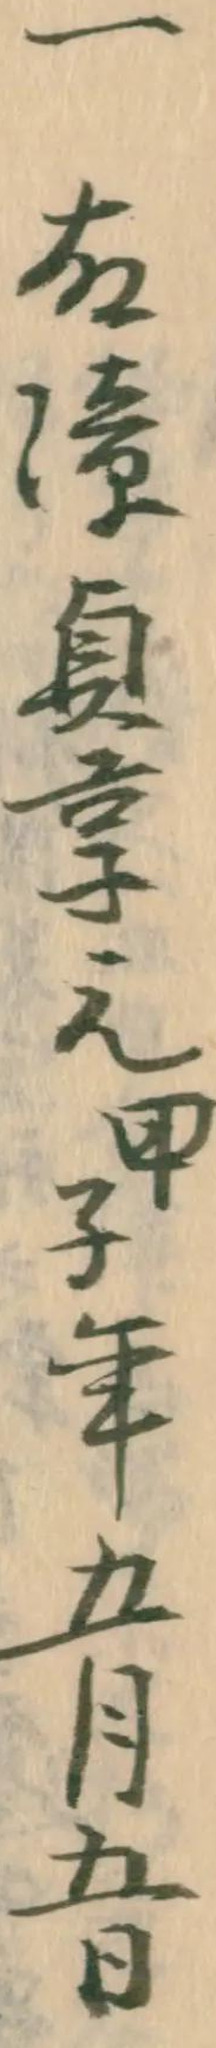一故障貞享元甲子年五月五日
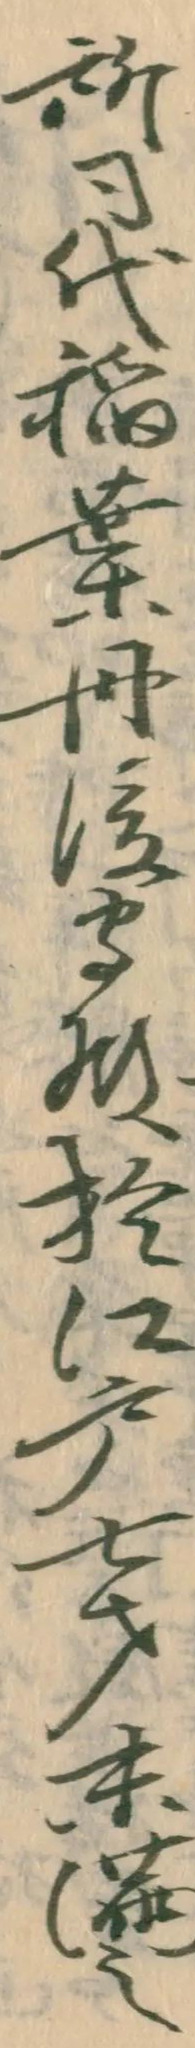所司代稲葉丹後守殿於江戸七才末満之
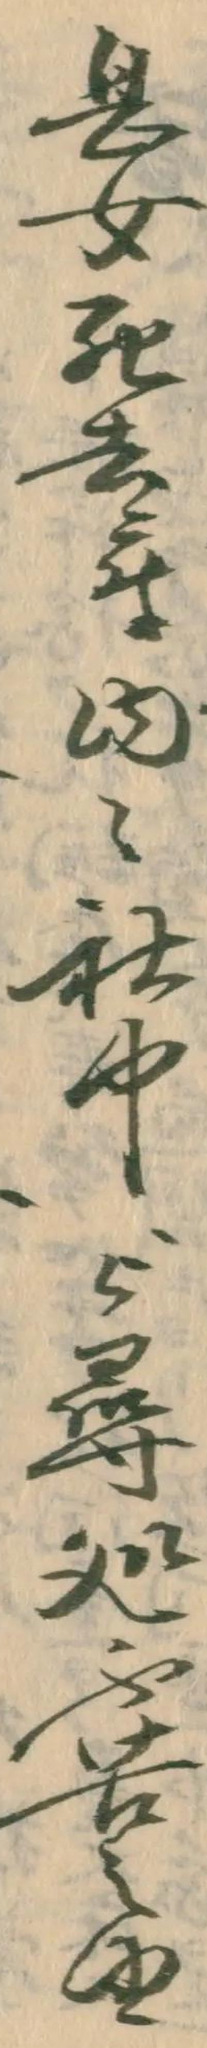息女死去二付内々社中へ被尋処不苦之由
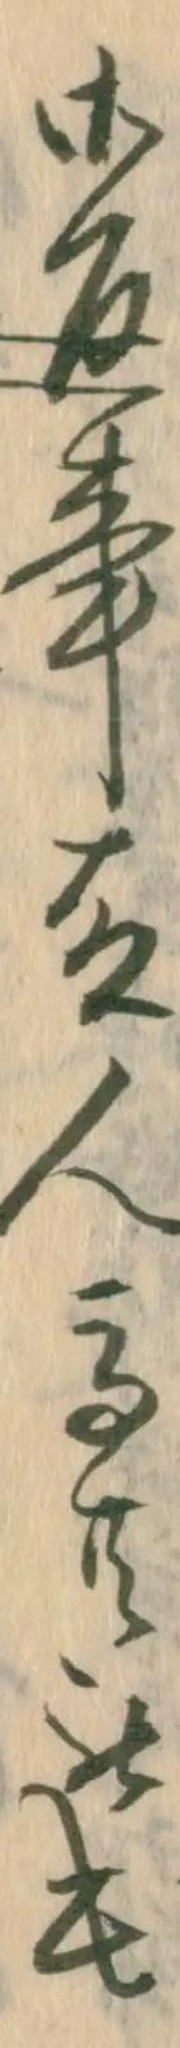御返事故人馬共被遣
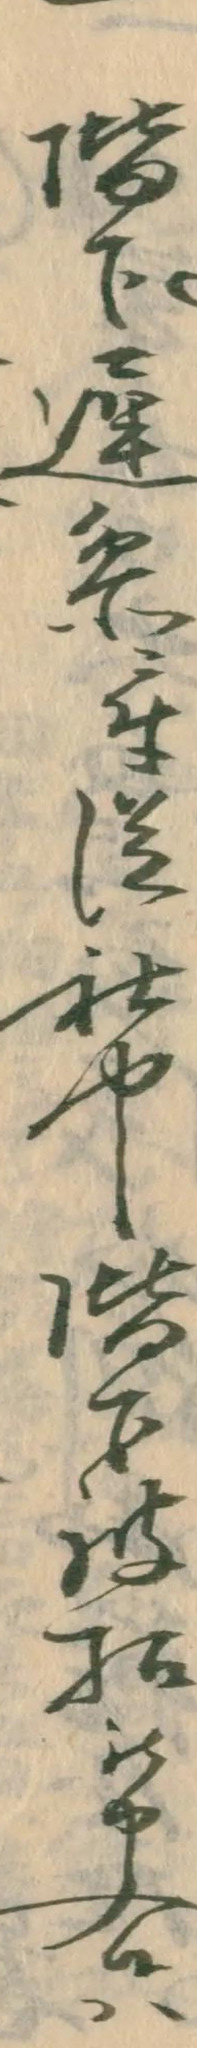一階下遅参ニ付従社中階下被招被申入候ハ
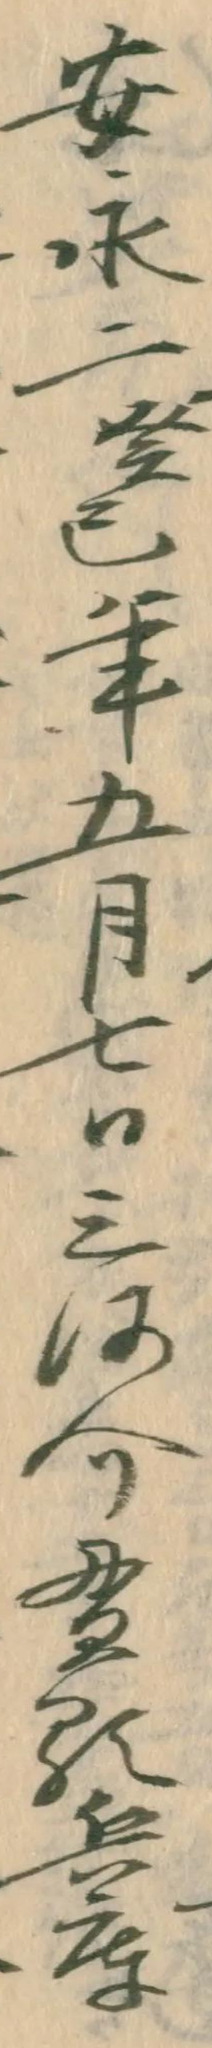安永二癸巳年五月七日三河介貫顕兵庫
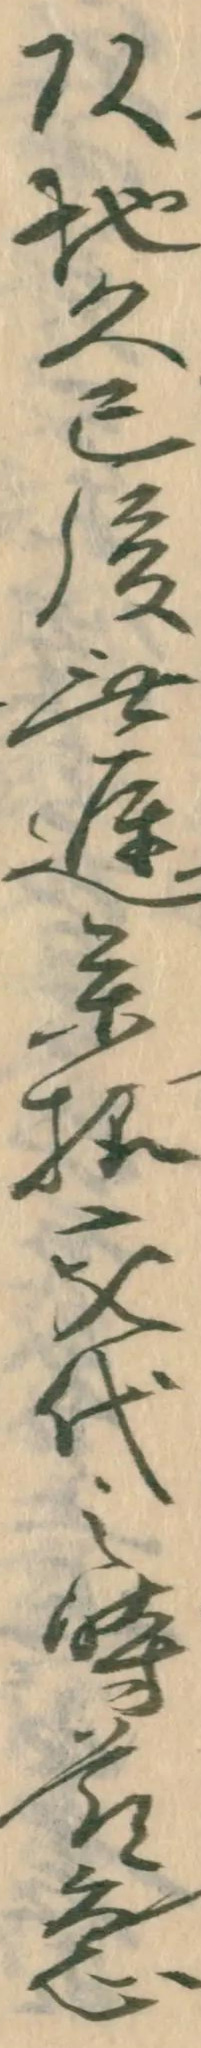頭地久已後無遅参様交代之時節急
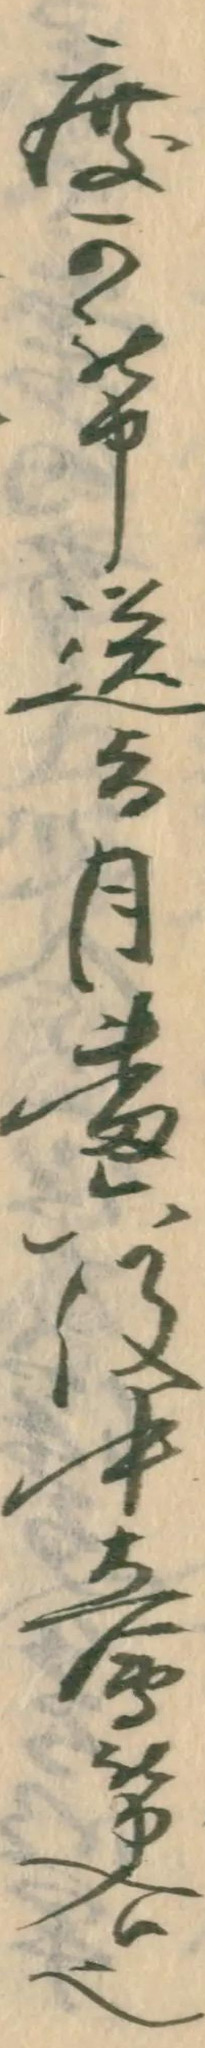度可被申送旨月番六役中立会被申入候也
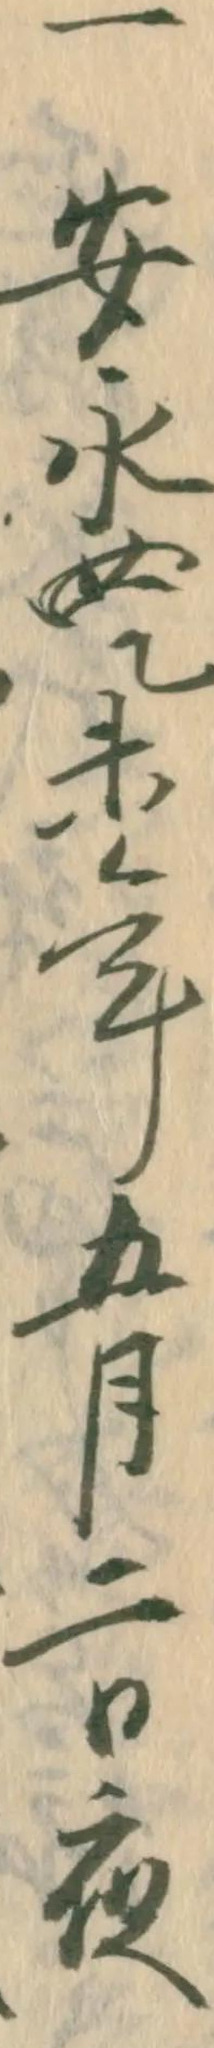一安永四乙未年五月二日夜
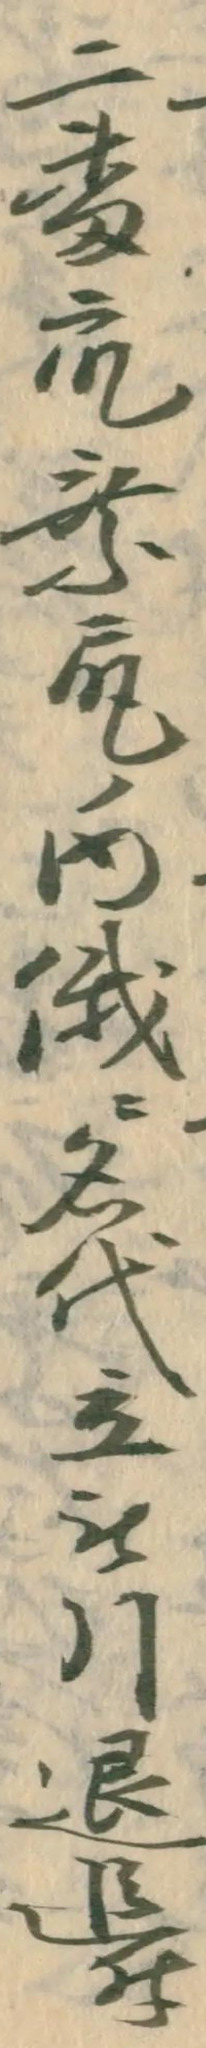二番衆乗尻ノ内俄ニ名代立被引退追付
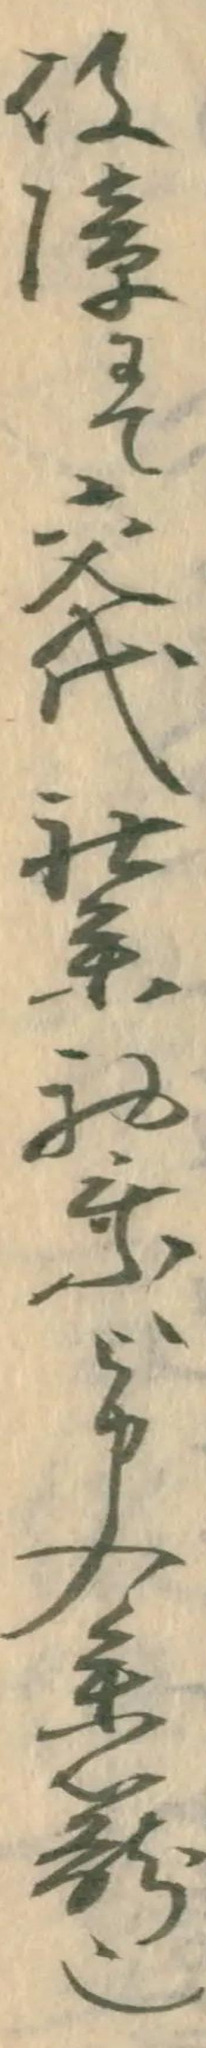故障にて六人代社参初乗へ被申入参籠也

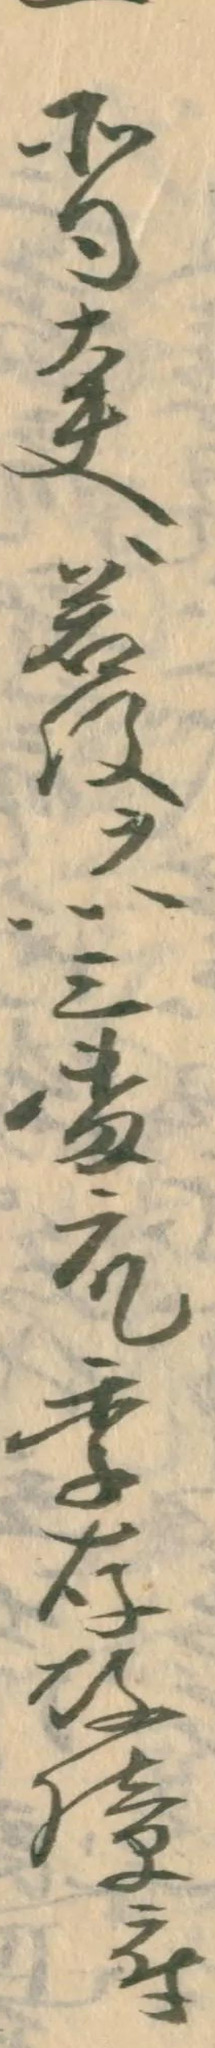一所司大夫へ若役ヲ以三番衆季存故障ニ付
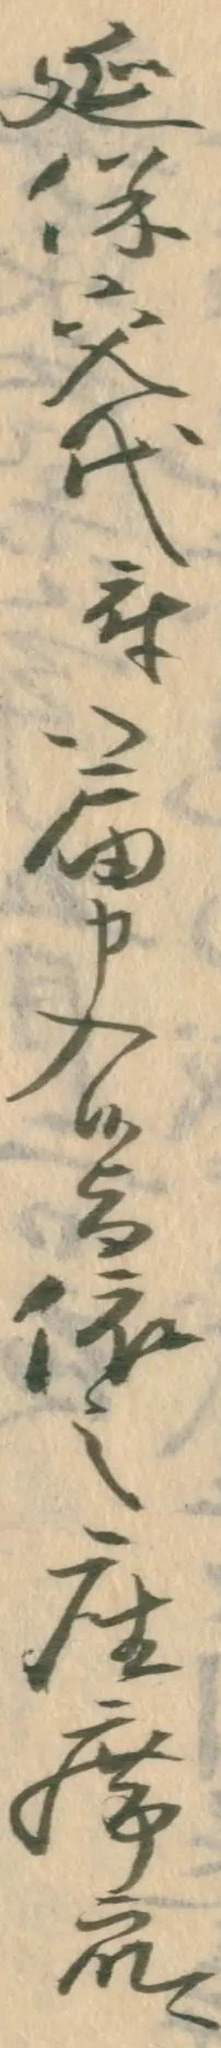延保交代ニ付御届申入候旨依之座席衆へ
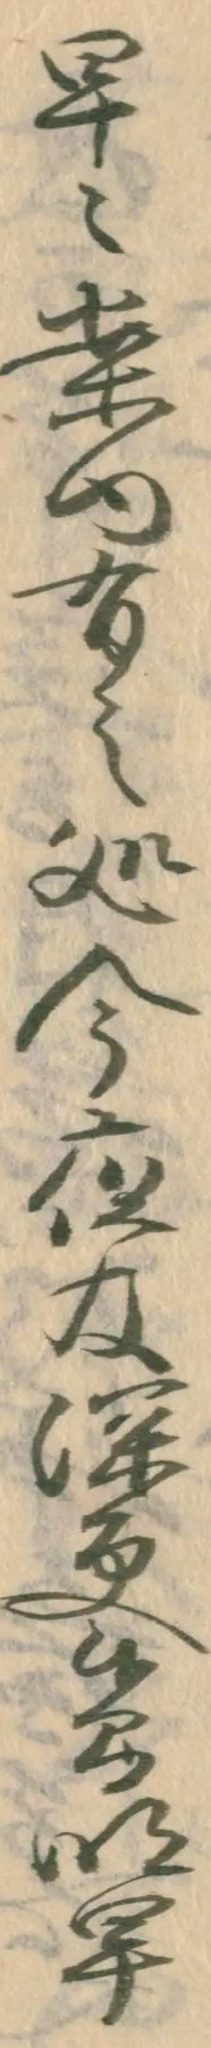早々案内有之処今夜及深更候間明早
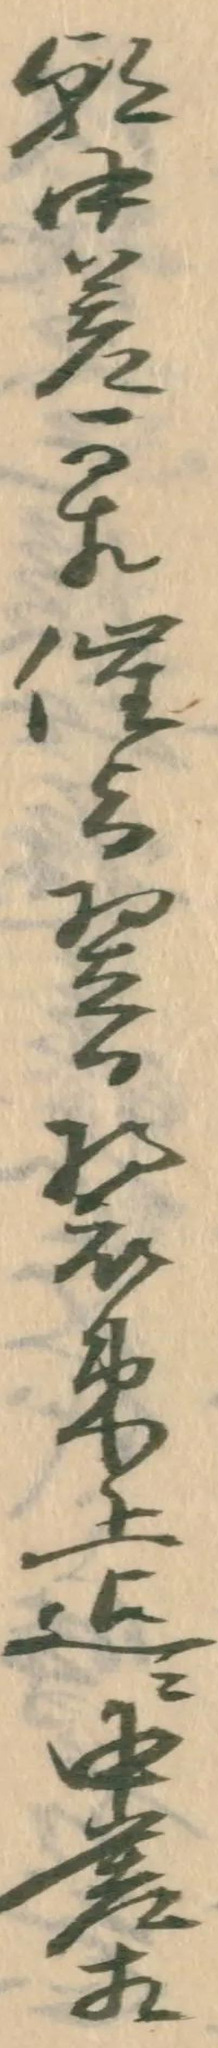朝中差可相催旨翌日装束上迄ニ申差相
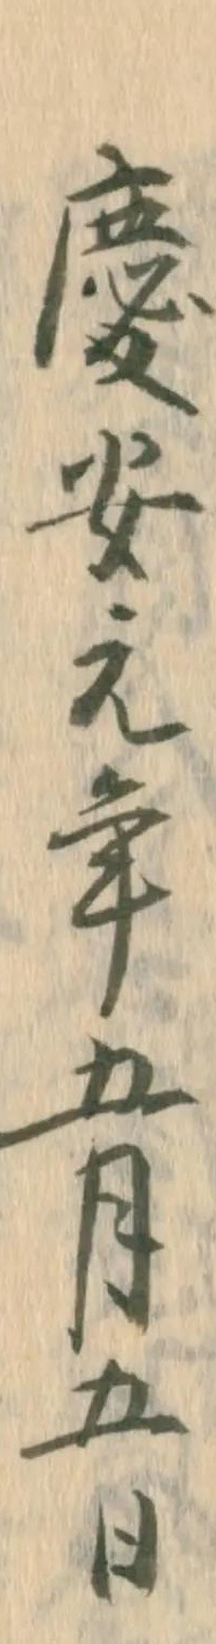一慶安元年五月五日
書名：賀茂社記録. 第12冊
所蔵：国立国会図書館 National Diet Library, JAPAN
